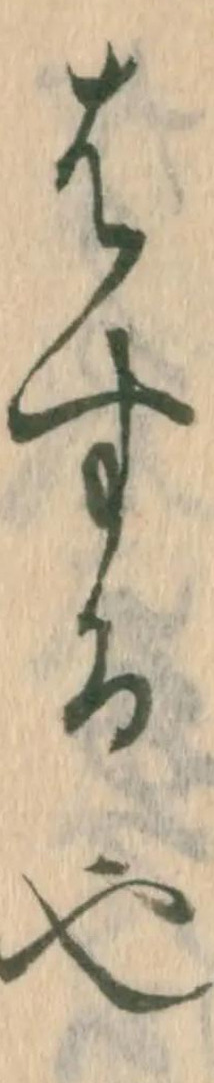はする也
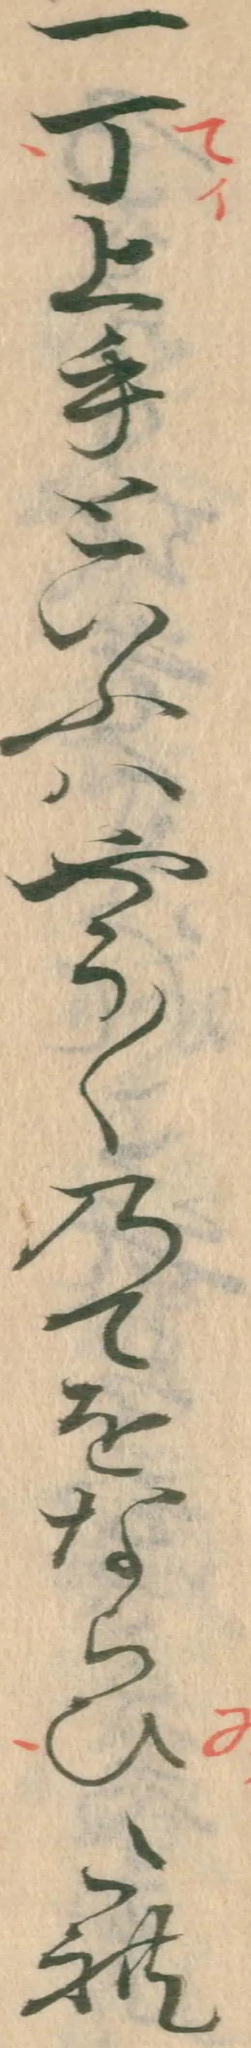一丁上手といふはやう〳〵のてをならひたれ
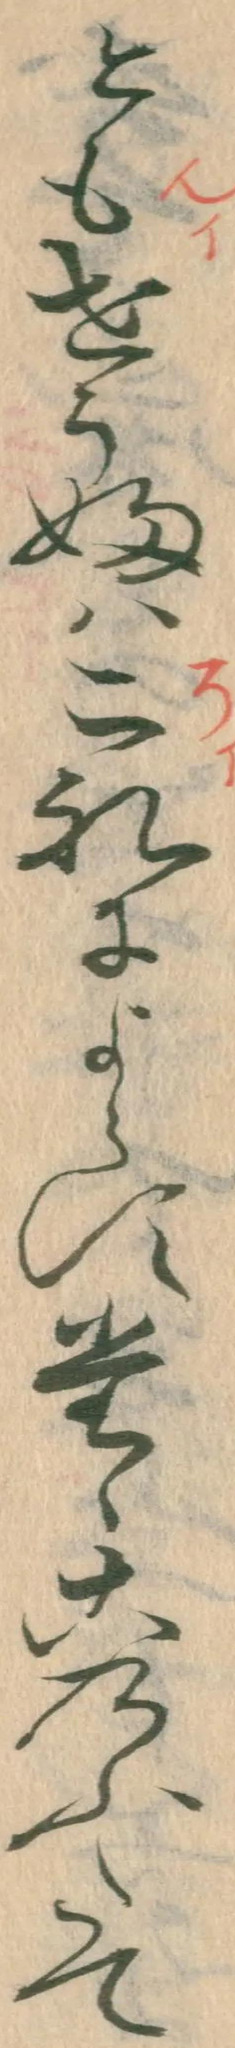ともせうふはこれによらすたゝこのふたて
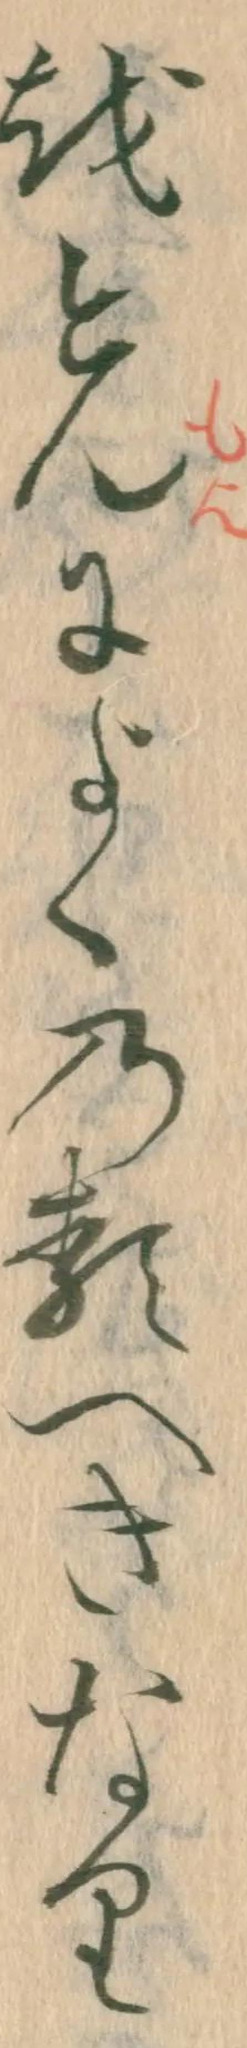をとんによくのるへきなり
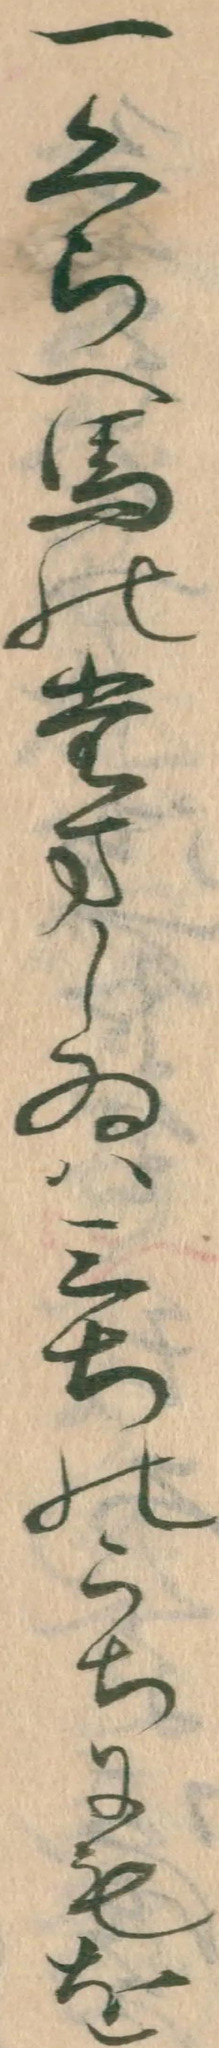一くらへ馬のたましゐはみちのうちにもを
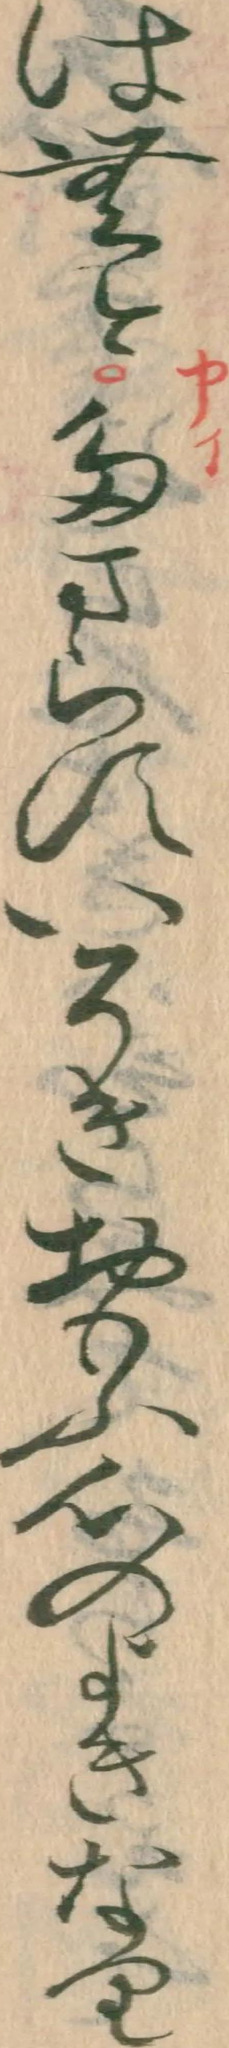はむと◦たまらすいそきおもふ心のよきなり
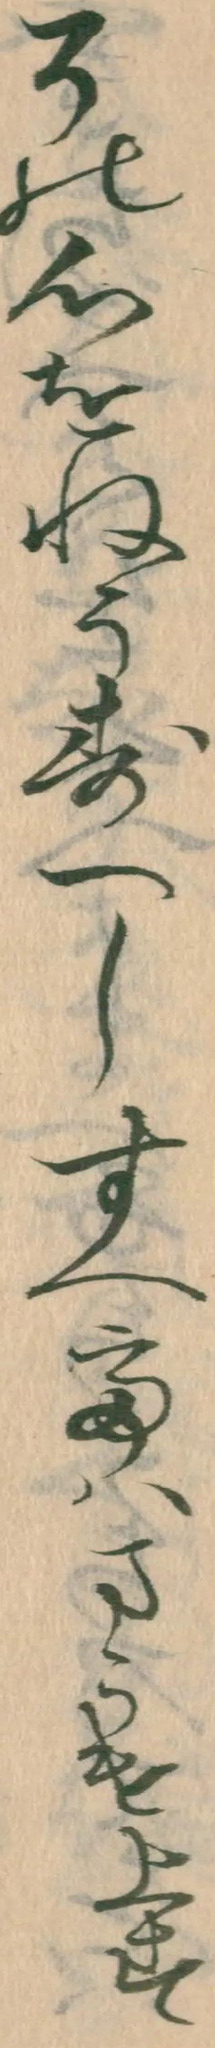その心をねうすへしすへてはまうけ上す
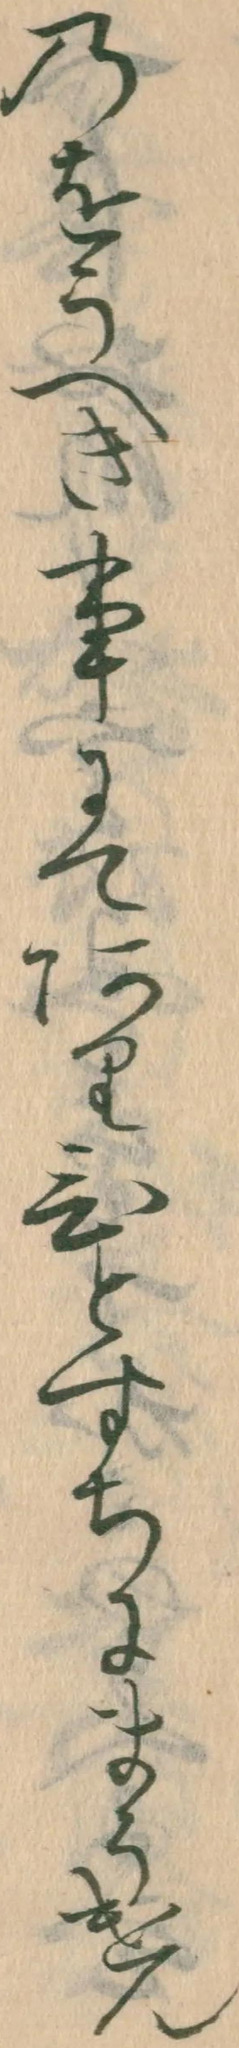のをうへき事にてありひとすちにまうけん
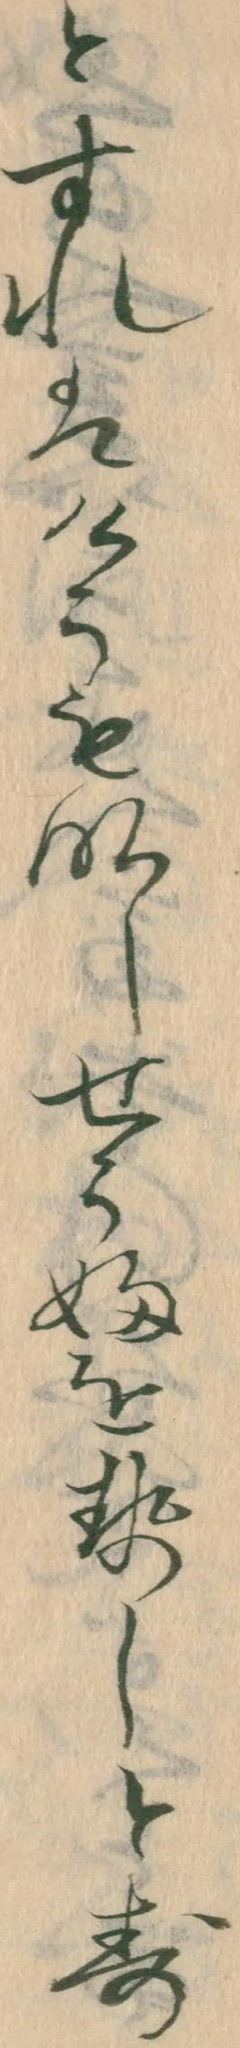とすれはけうもなしせうふをせしとす
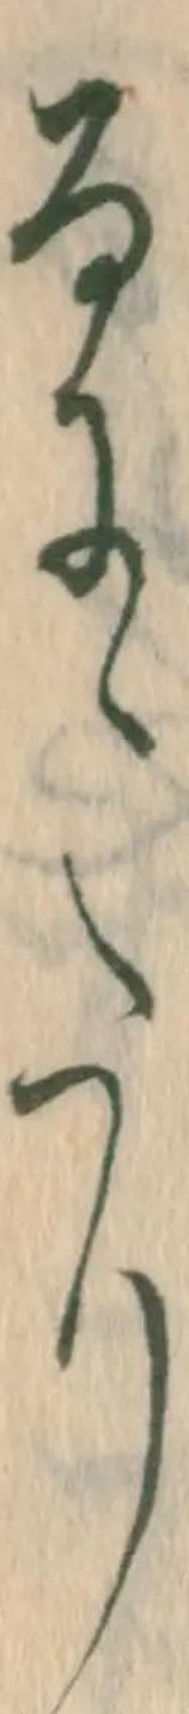るにゝたり
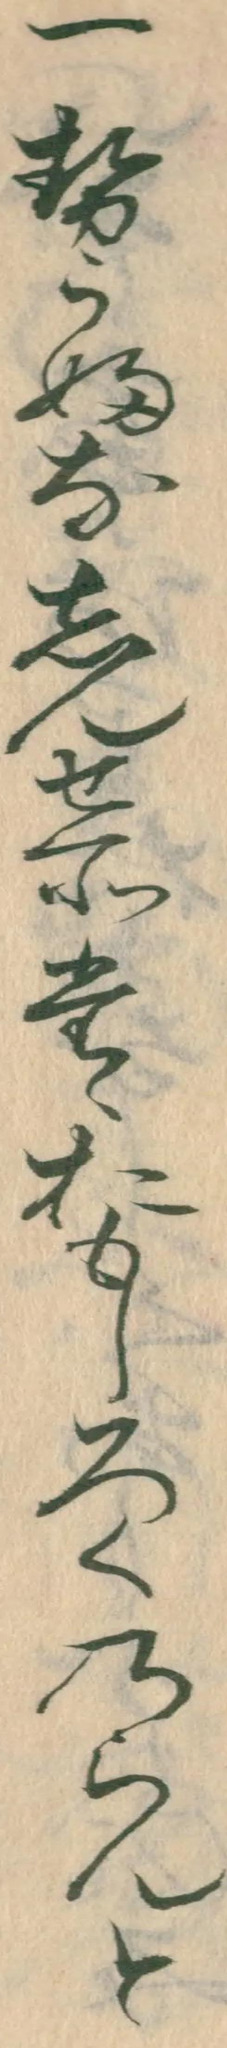一せうふなしんせそたゝおもしろくのらんと
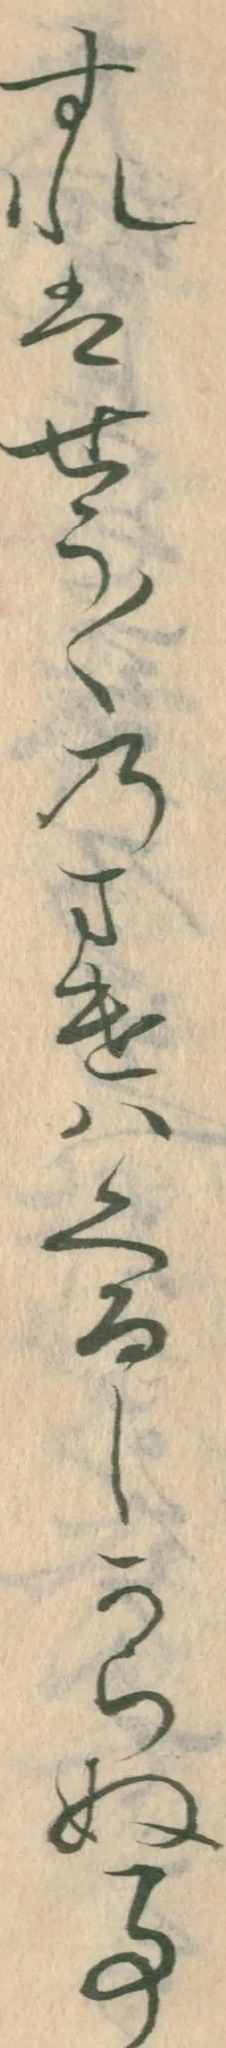すれはせう〳〵のまけはくるしからぬ事
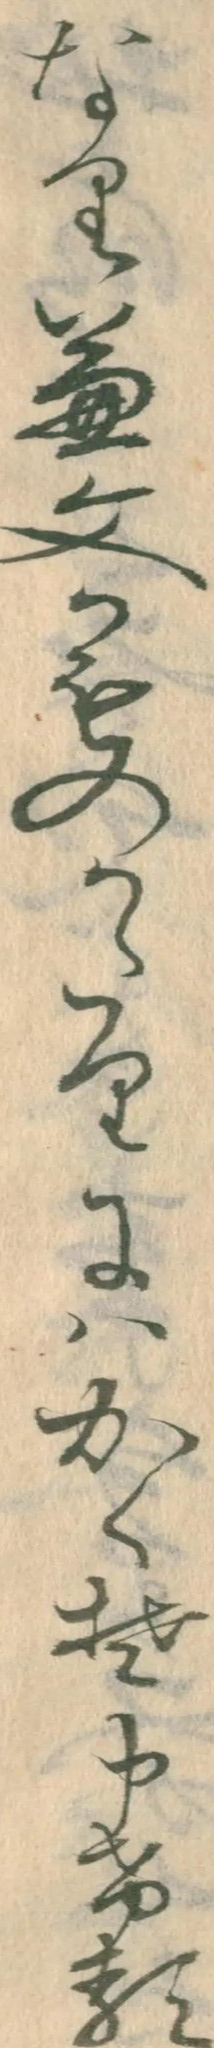なり兼文かものかたりにはかくそ申ける
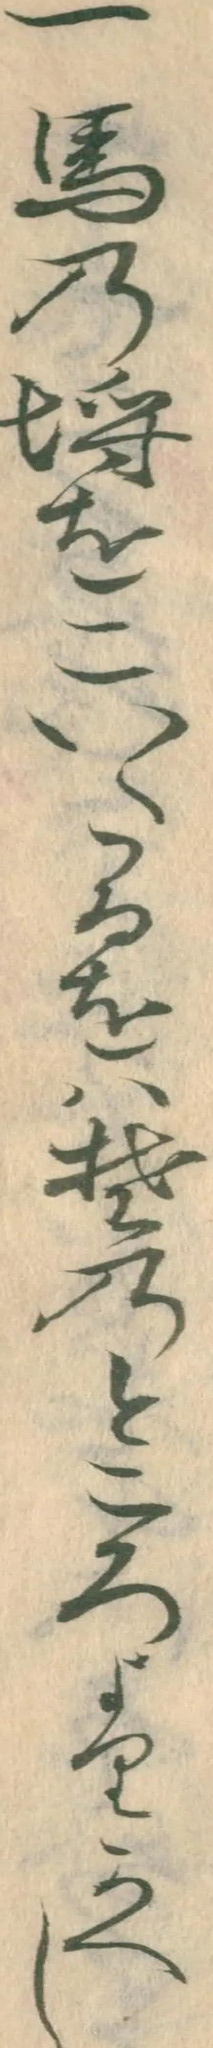一馬の埒をこいたるをはそのところよりかへし
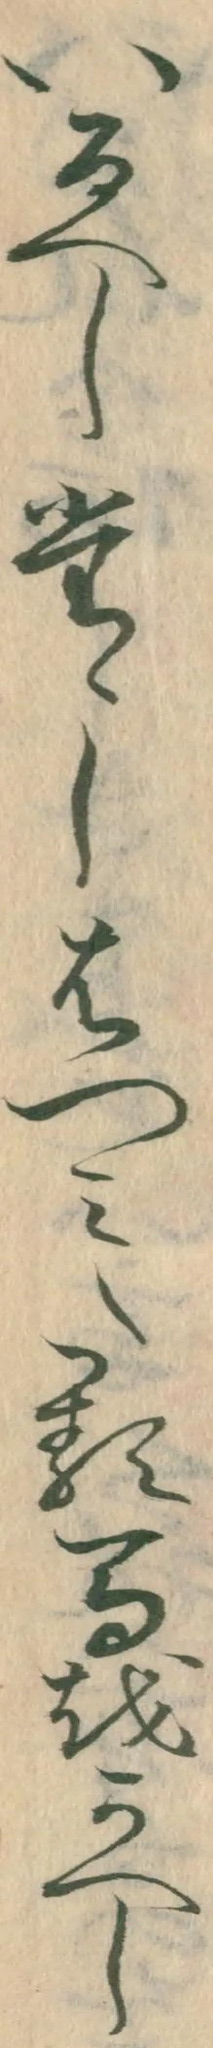いるへしたゝしはつみたる馬をかへし

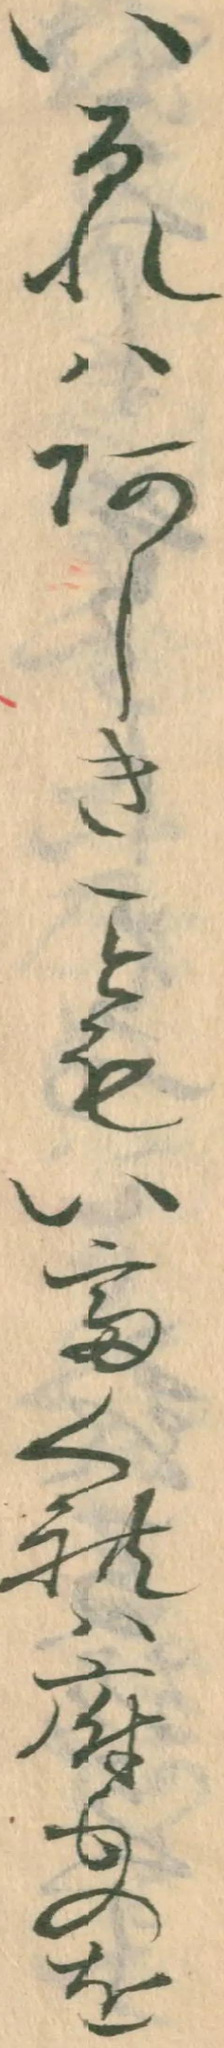いるれはあしきこともいてくれは府ものを
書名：賀茂社記録. 第13冊
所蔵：国立国会図書館 National Diet Library, JAPAN
